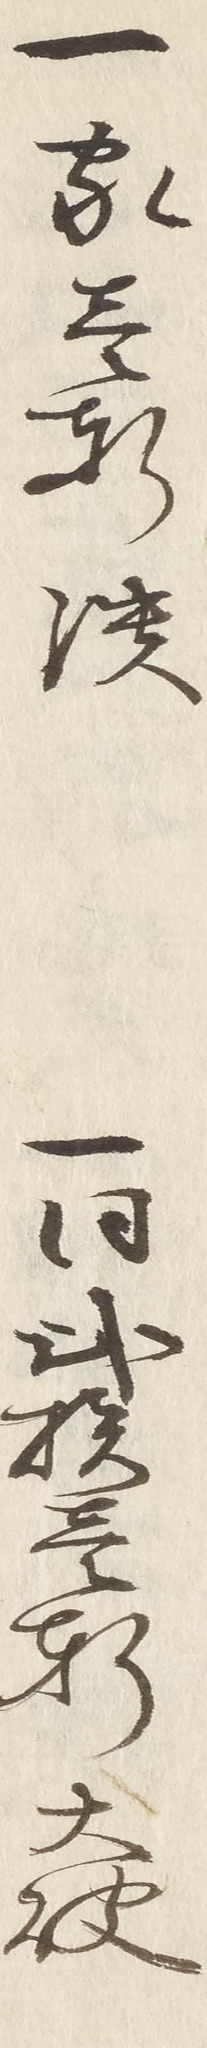一家壱軒潰一同弐拾壱軒大破
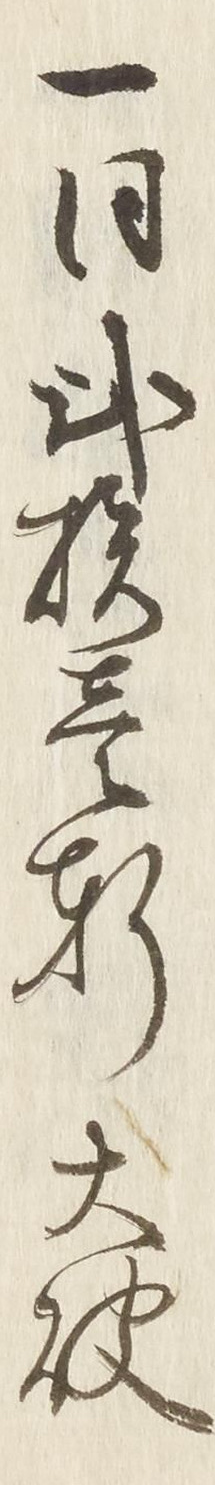一同弐拾五軒大破
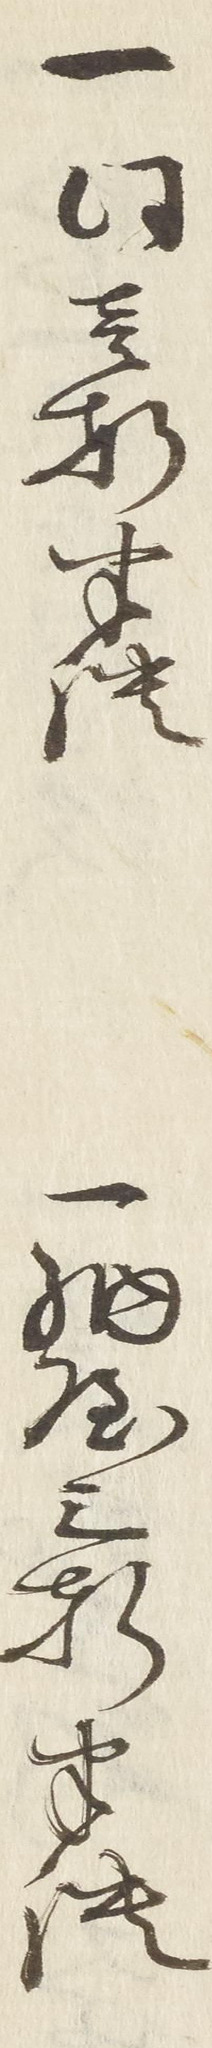一同壱軒半潰一納屋三軒半潰
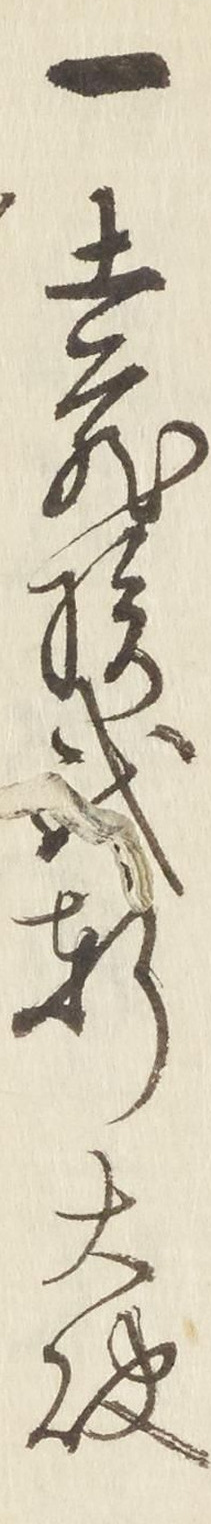一同弐拾五軒大破
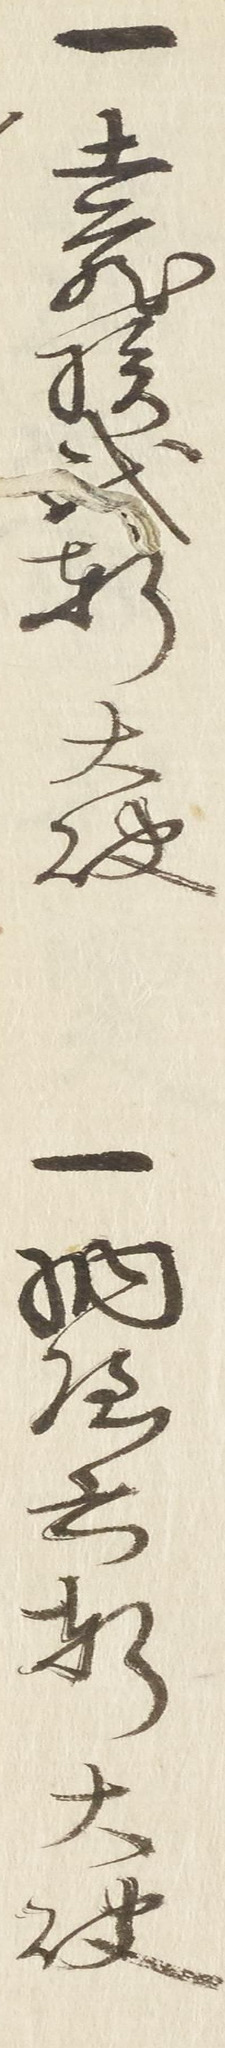一土蔵拾弐軒大破一納屋六軒大破
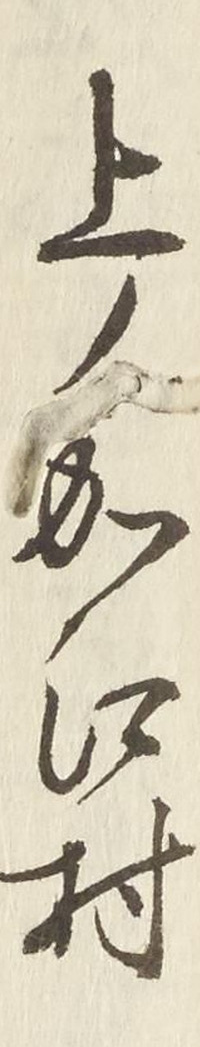上ノ加江村
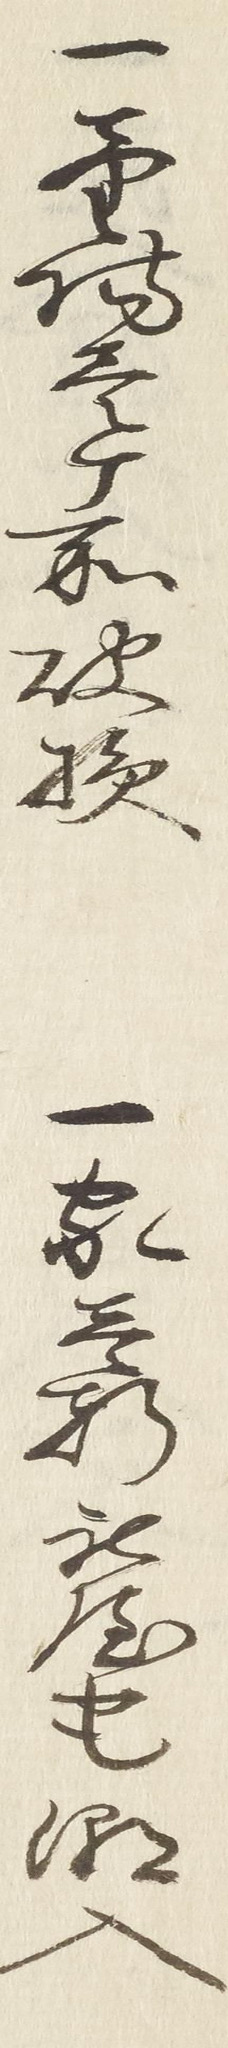一台場壱ヶ所破損一家壱軒庄屋宅潮入
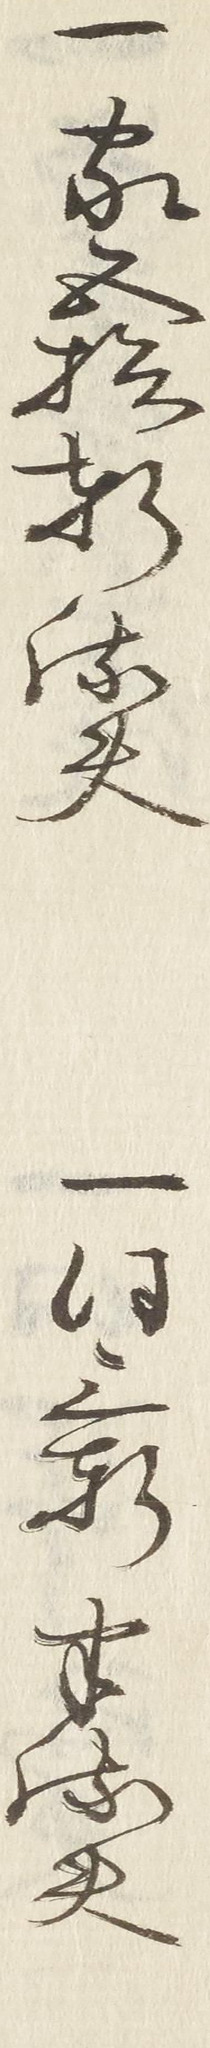一家五拾軒流失一同三軒半流失
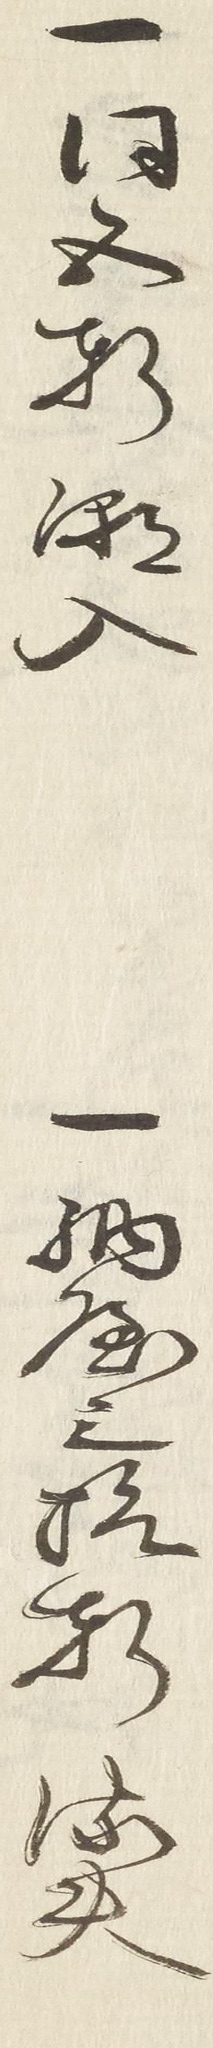一同五軒潮入一納屋三拾軒流失
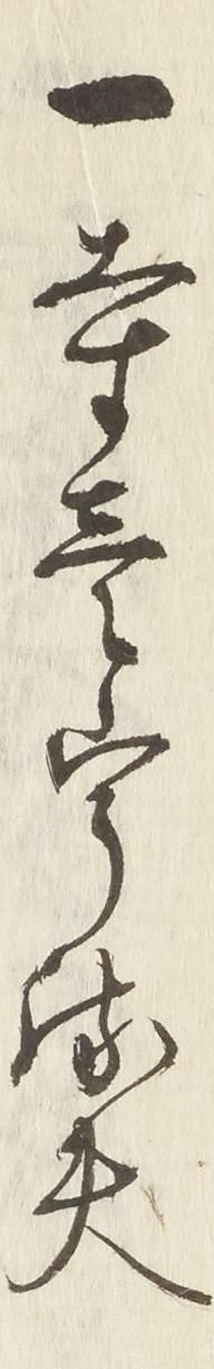一寺壱宇流失
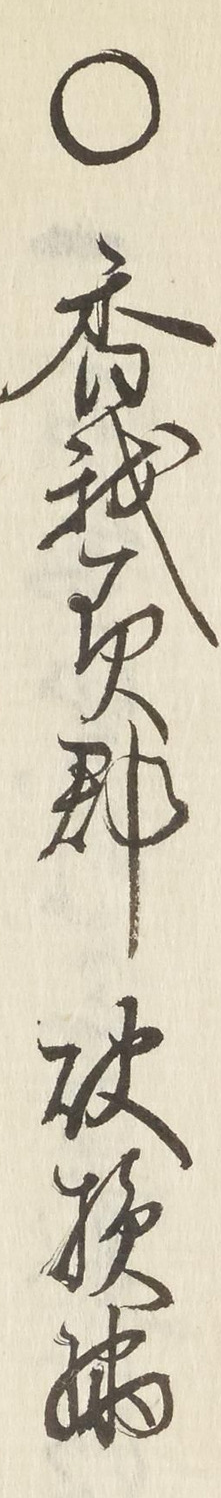◯香我美郡破損縮
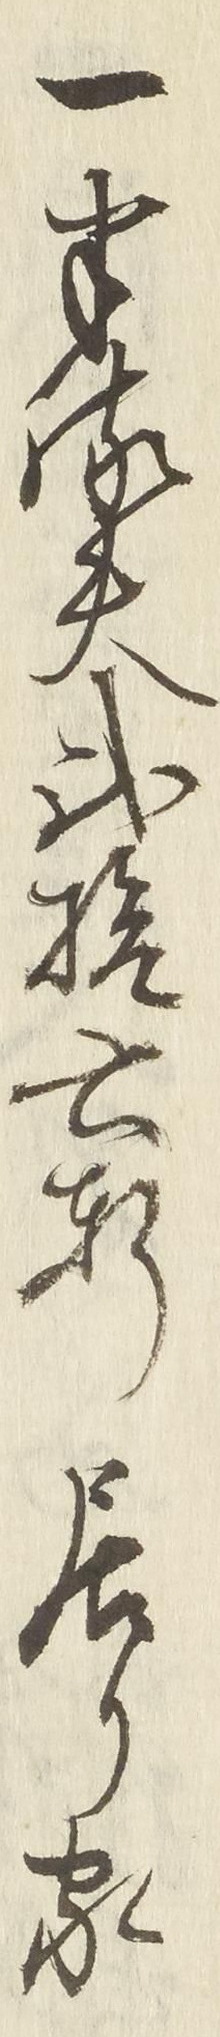一半流失弐拾六軒居り家

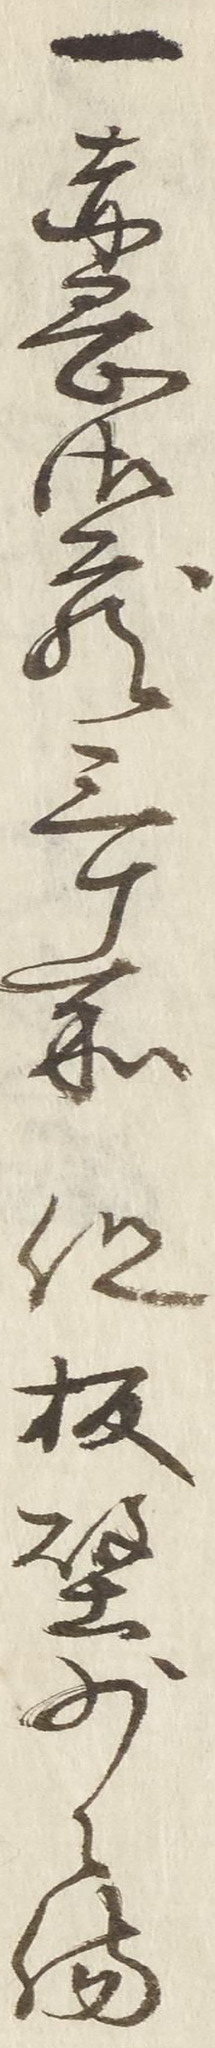一赤岡御蔵三ヶ所但板壁少々傷
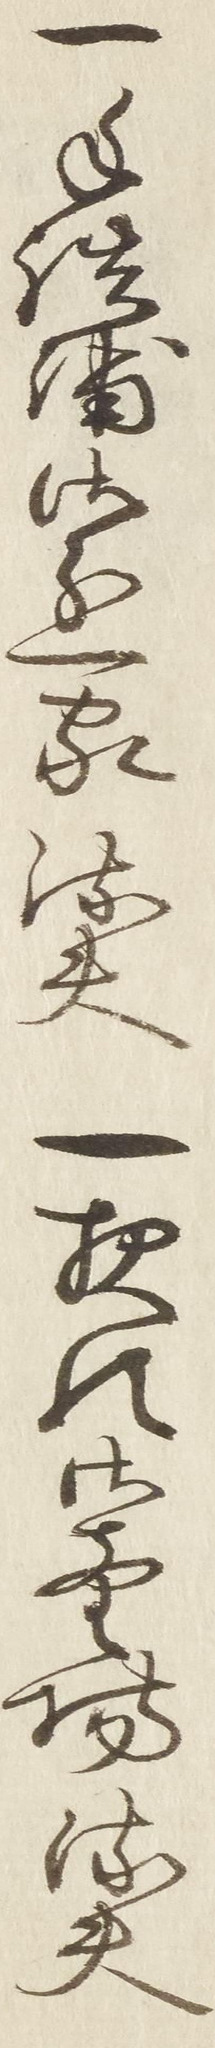一手結浦御分一家流失一夜須御台場流失
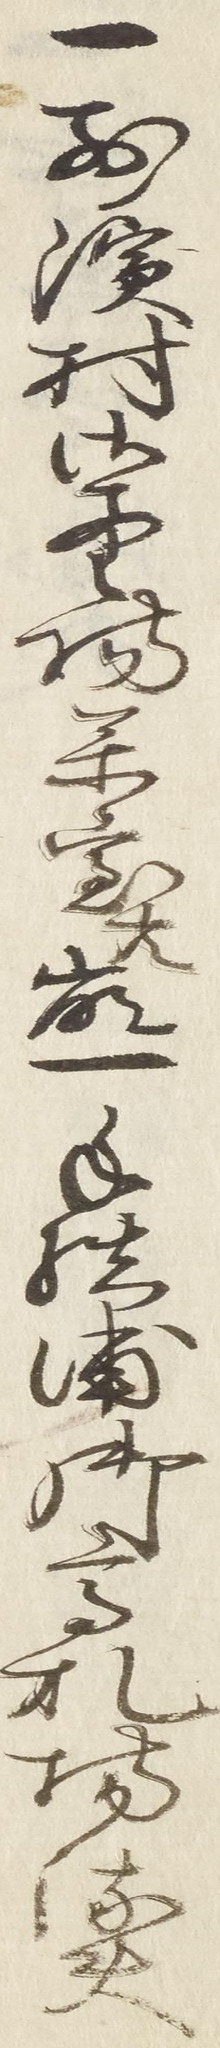一前浜村御売場米室共崩一手結浦御高札場流失
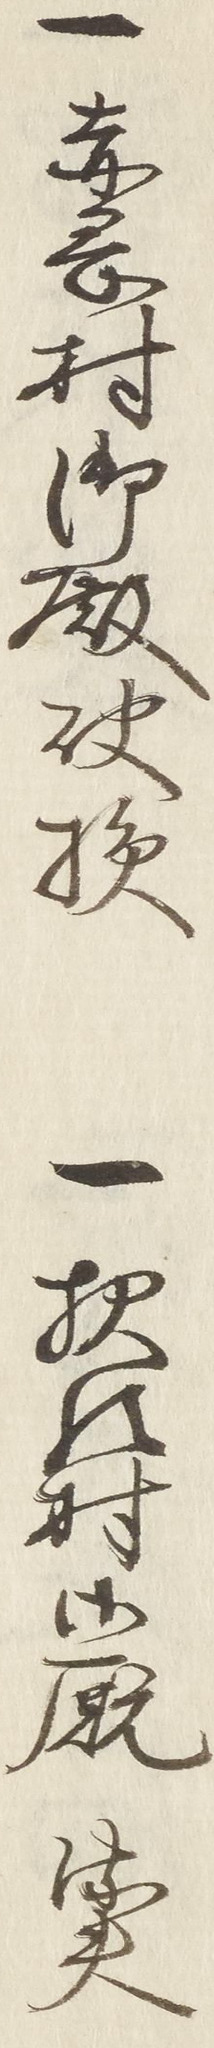一赤岡村御殿破損一夜須村御厩流失
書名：地震記　下
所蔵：東京大学地震研究所図書室 Earthquake Research Institute Library, The University of Tokyo, JAPAN
